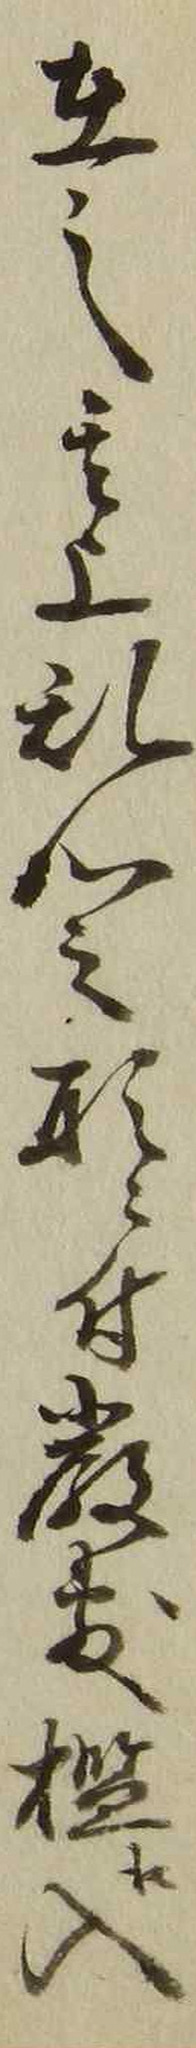在之其上乱心之形ニ付厳敷檻江入
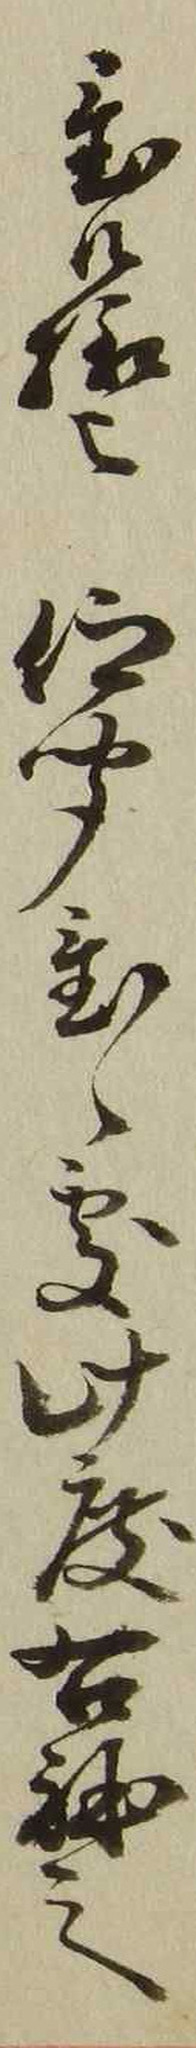置候様被仰聞置候処此度右躰之
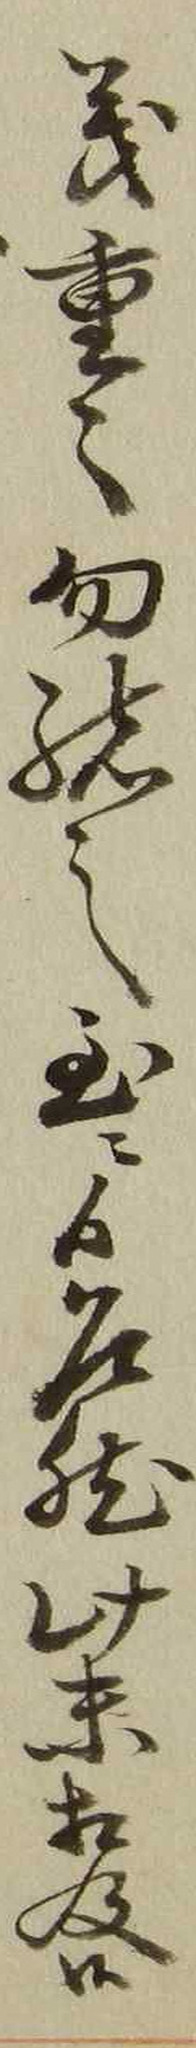義重々忽諸之至ニ付乍然此末相及候
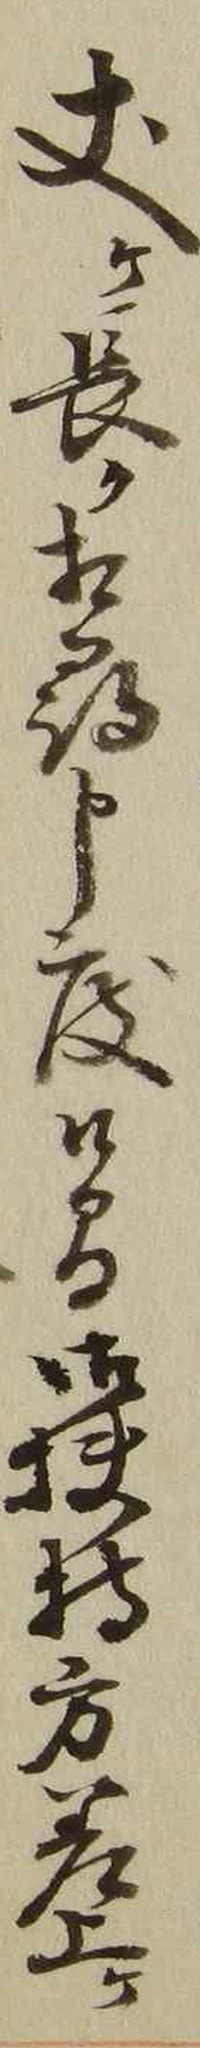丈ケ長ク相尋申度候間御扶持方差上ケ
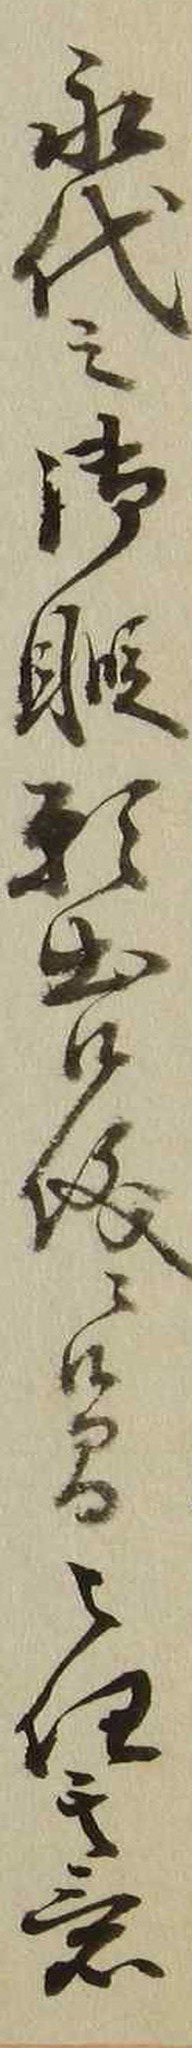永代之御暇願出候儀ニ候間被任其意
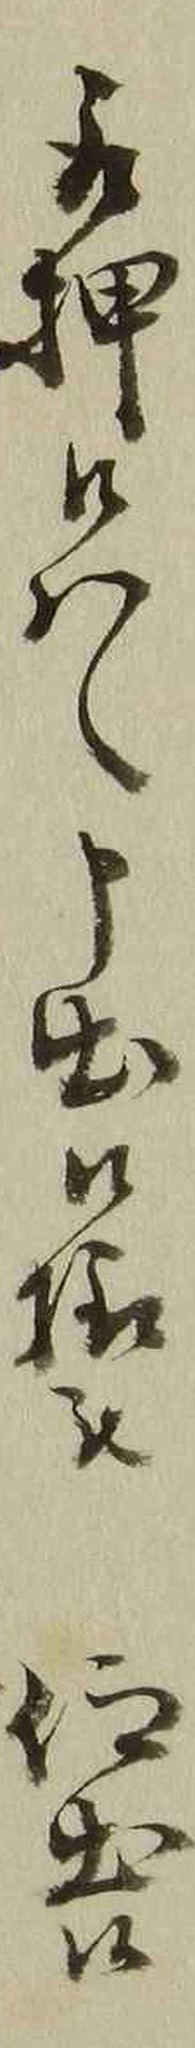取押候ハヽ申出候様被仰出候
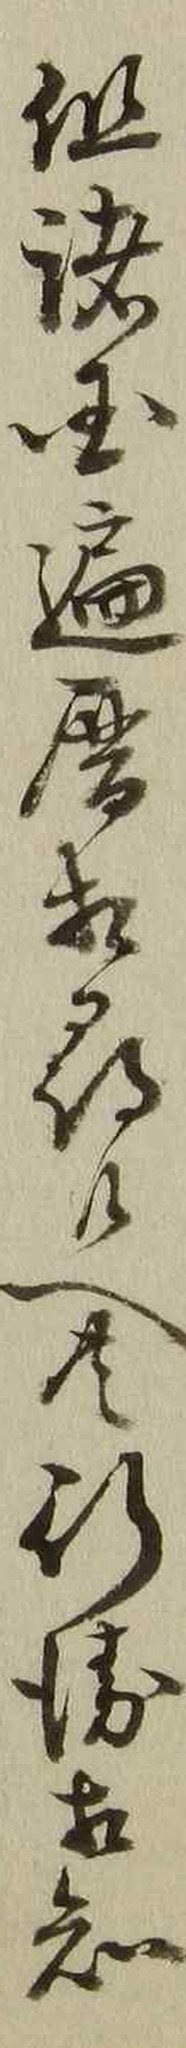但諸国遍歴相尋候得共行衛相知
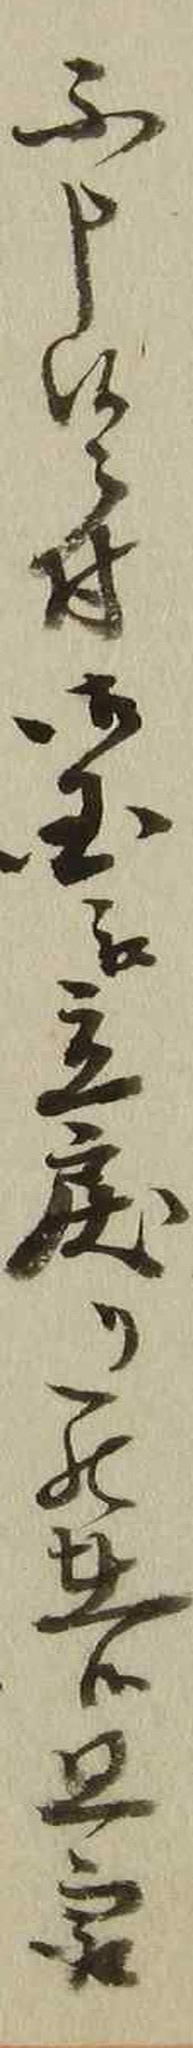不申候ニ付御国江立戻リ罷在候且最
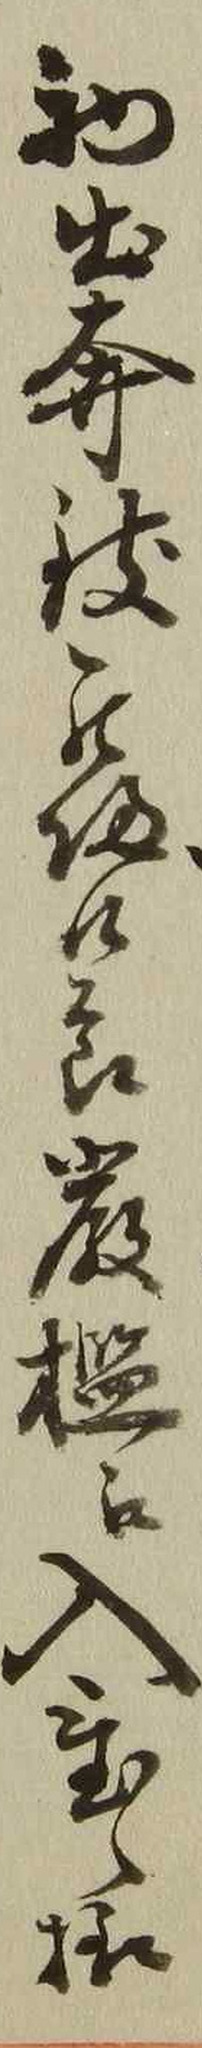初出奔致罷帰候節厳檻江入置候様
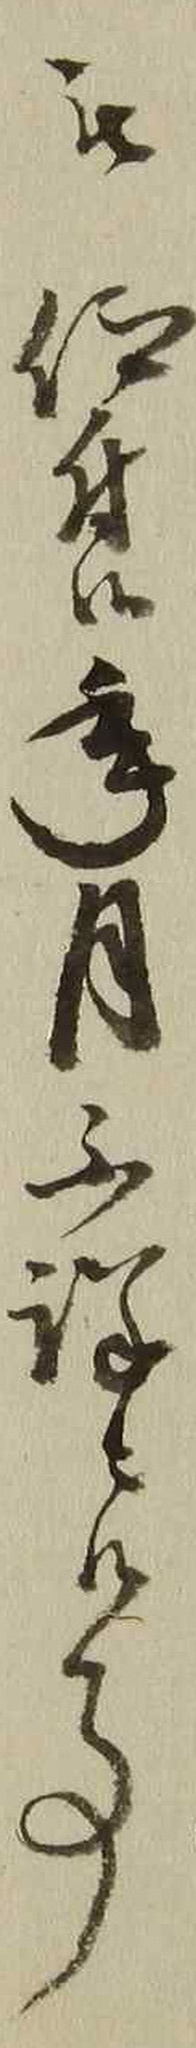被仰付候年月不詳ニ候事
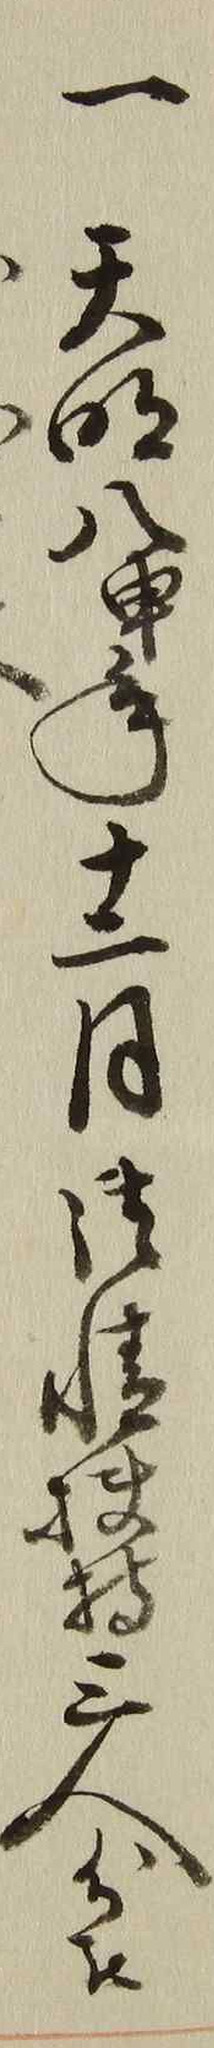一天明八申年十二月御情扶持三人分被
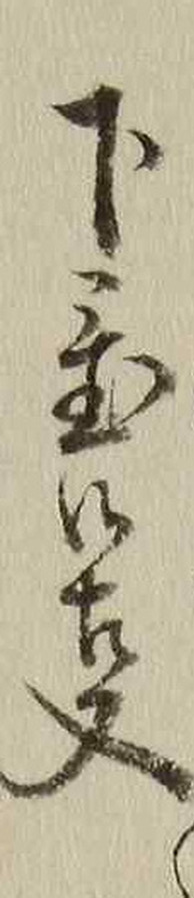下置候事
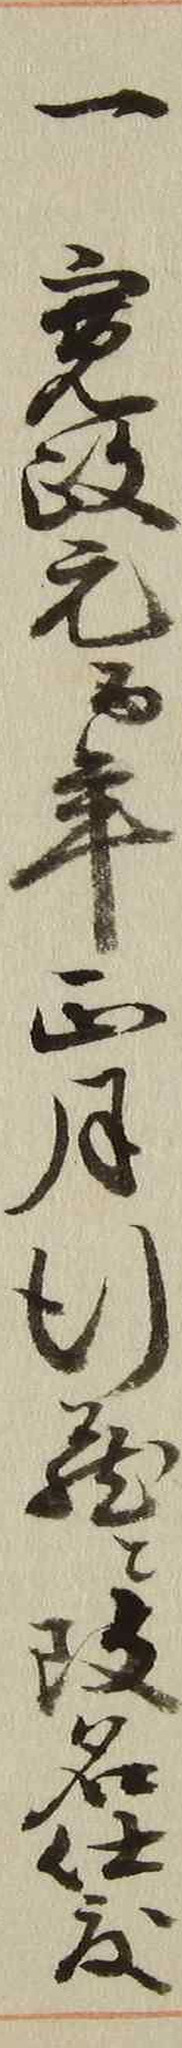一寛政元酉年正月行蔵と改名仕度
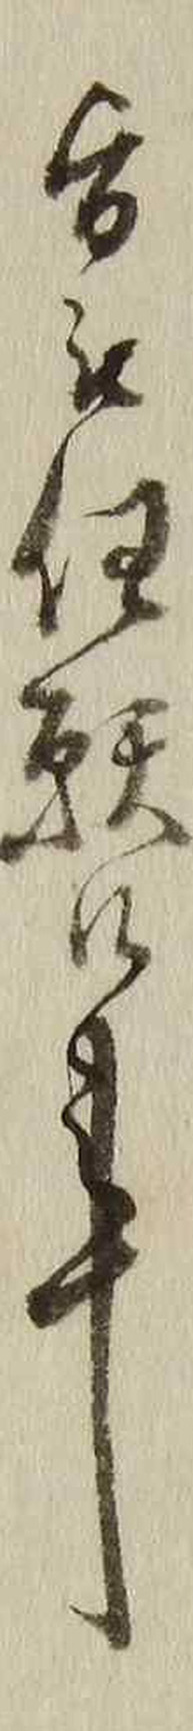旨被任願候事
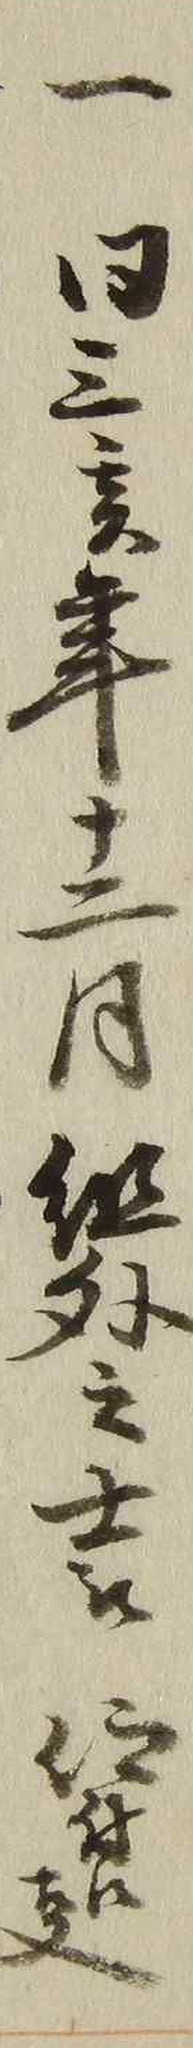一同三亥年十二月組外之士被仰付候事
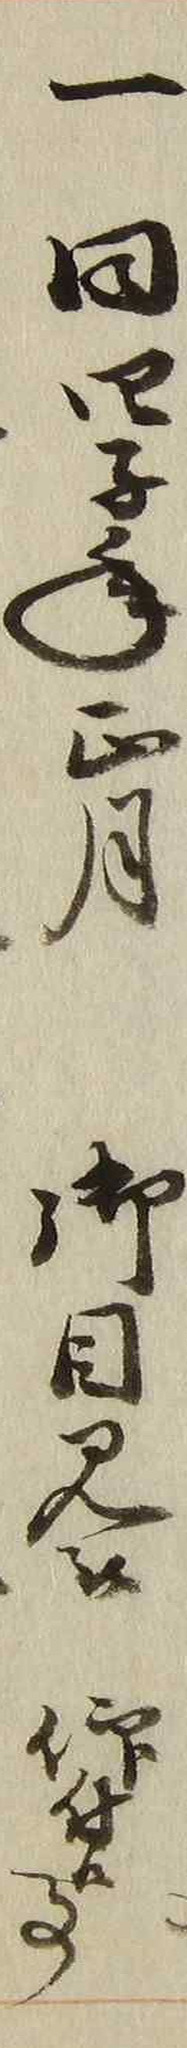一同四子正月御目見被仰付候事
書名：諸士系譜　巻之31　い之部31
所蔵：会津若松市立会津図書館
